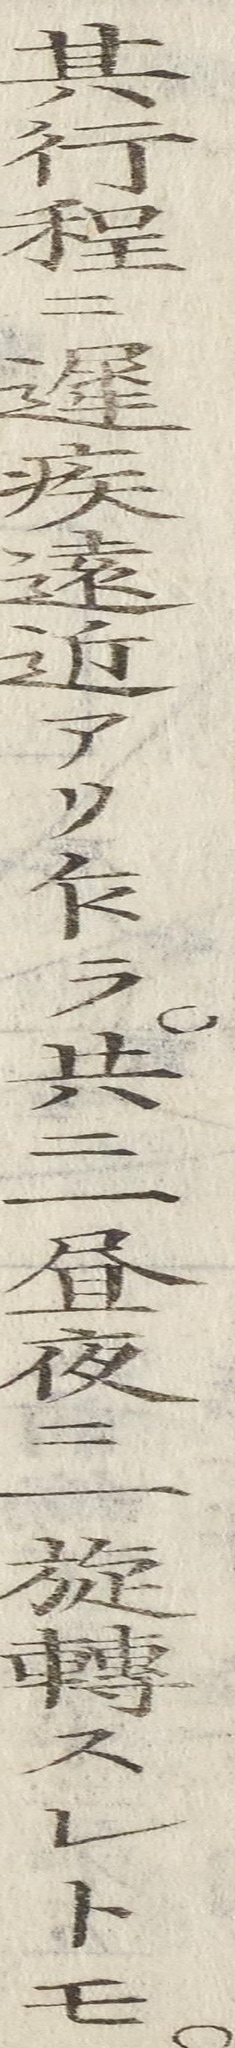其行程ニ遅疾遠近アリ乍ラ。共ニ一昼夜ニ一旋転スレトモ。
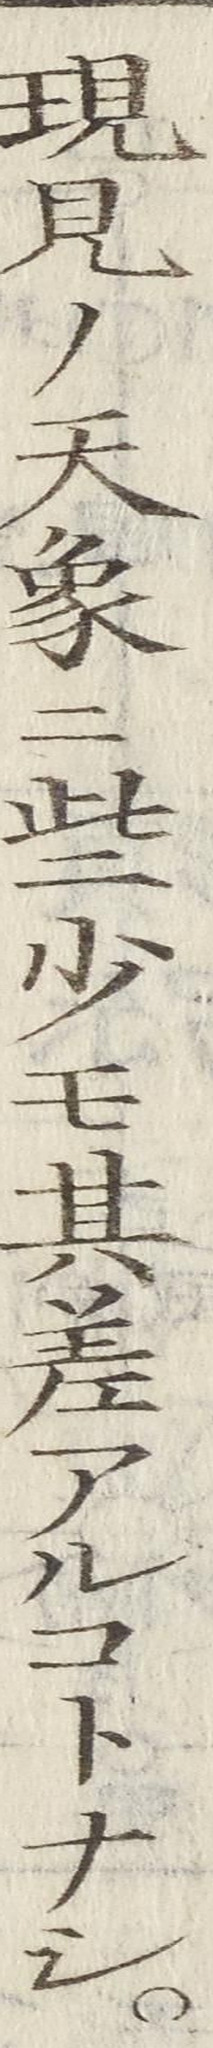現見ノ天象ニ些少モ其差アルコトナシ。
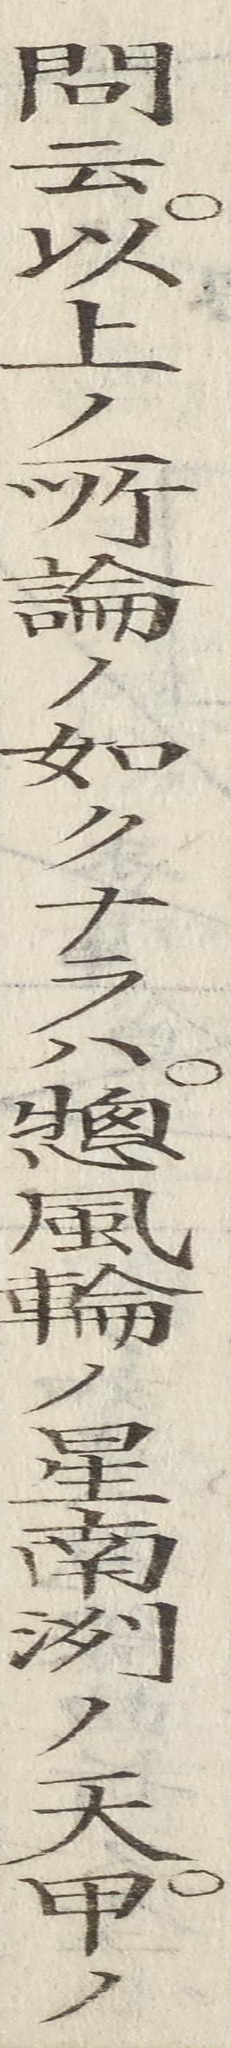問云。以上ノ所論ノ如クナラハ。惣風輪ノ星南洲ノ天。甲ノ
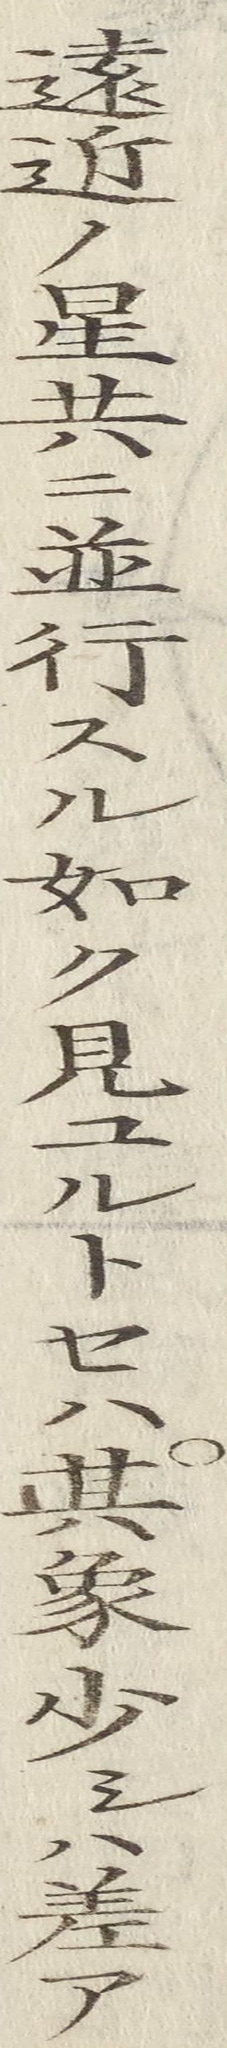遠近ノ星共ニ並行スル如ク見ユルトセハ。其象少シハ差ア
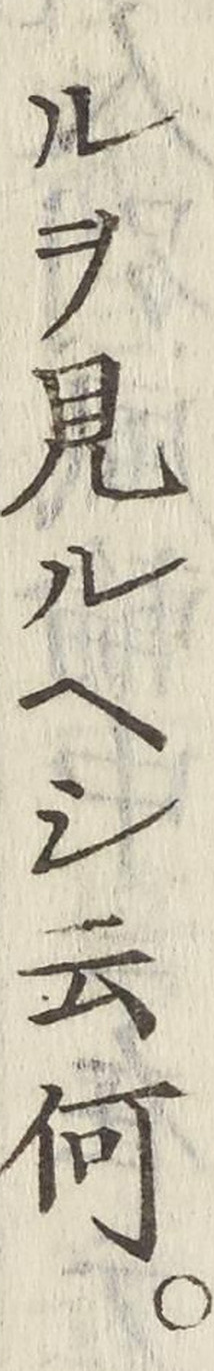ルヲ見ルヘシ云何。
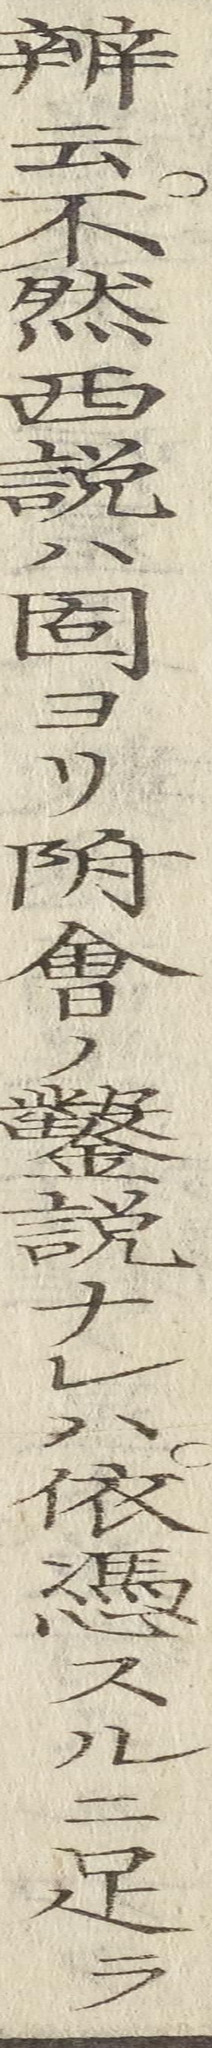弁云。不然西説ハ固ヨリ附会ノ鑿説ナレハ。依憑スルニ足ラ
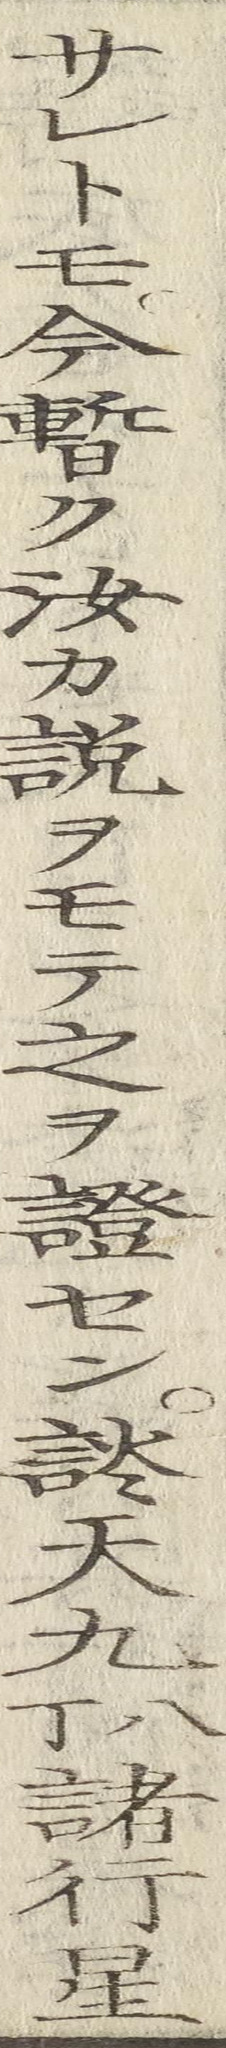サレトモ。今暫ク汝カ説ヲモテ之ヲ証セン。談天九八丁諸行星
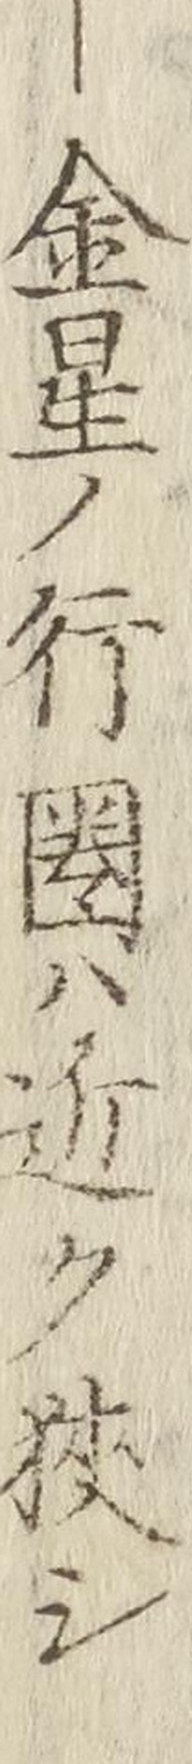ヘ金星ノ行圏ハ近ク狭シ
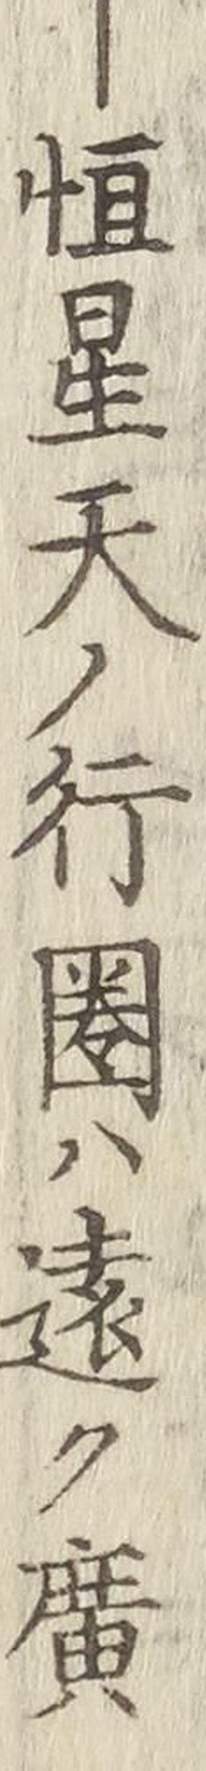恒星天ノ行圏ハ遠ク広

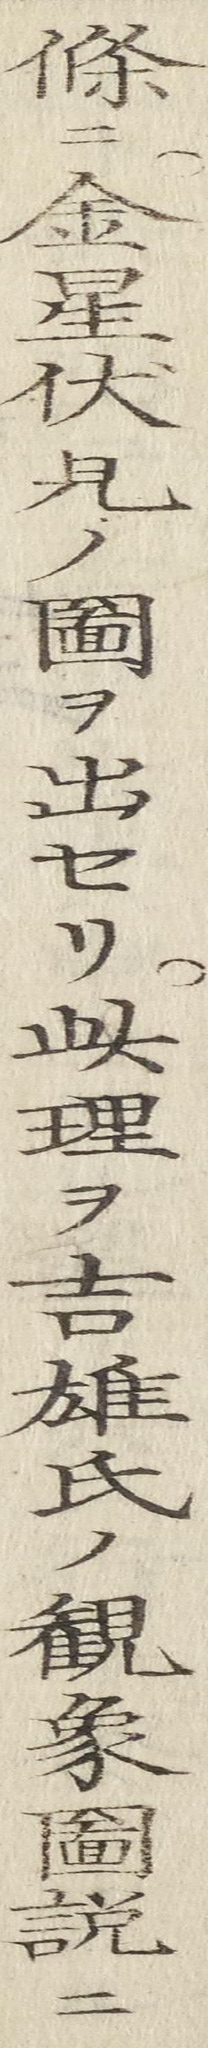条ニ。金星伏見ノ図ヲ出セリ。此理ヲ吉雄氏ノ観象図説ニ
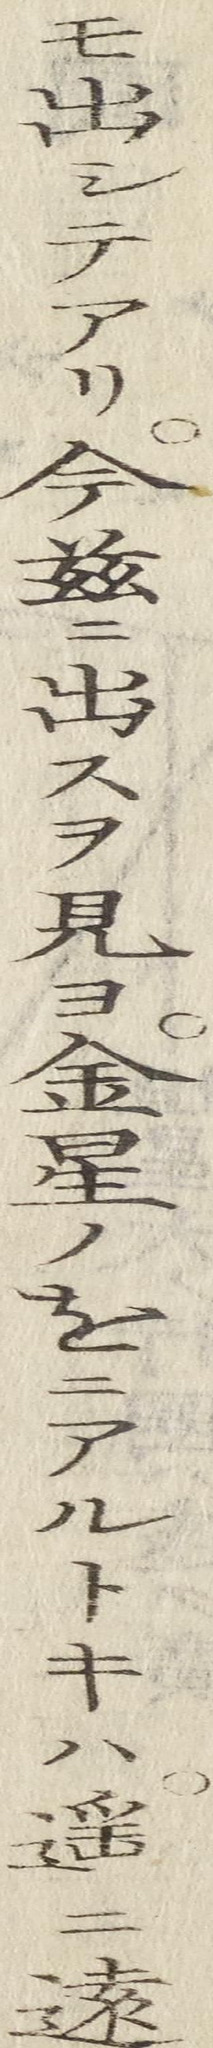モ出シテアリ。今茲ニ出スヲ見ヨ。金星ノをニアルトキハ。遥ニ遠
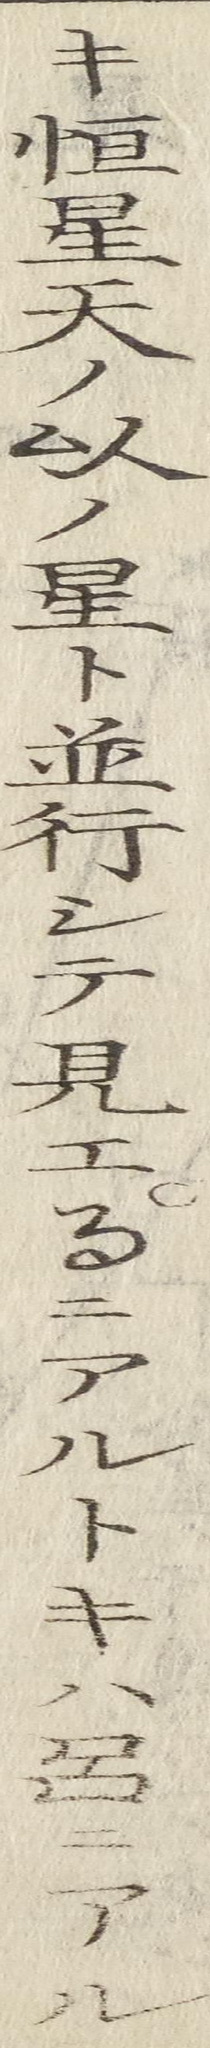キ恒星天文ノ叺ノ星ト並行シテ見エ。るニアルトキハ呂ニアル
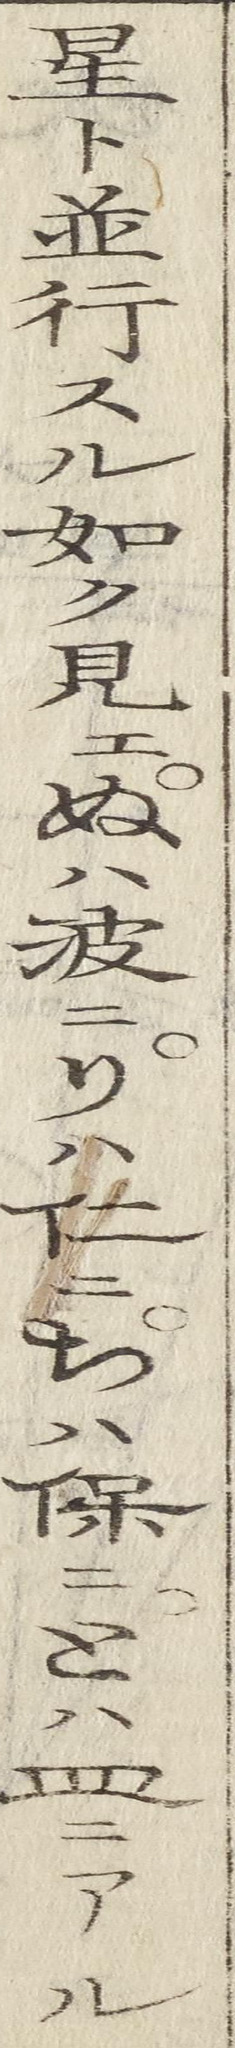星ト並行スル如ク見エ。ぬハ波ニ。リハ仁ニ。ちハ保ニ。とハ皿ニアル
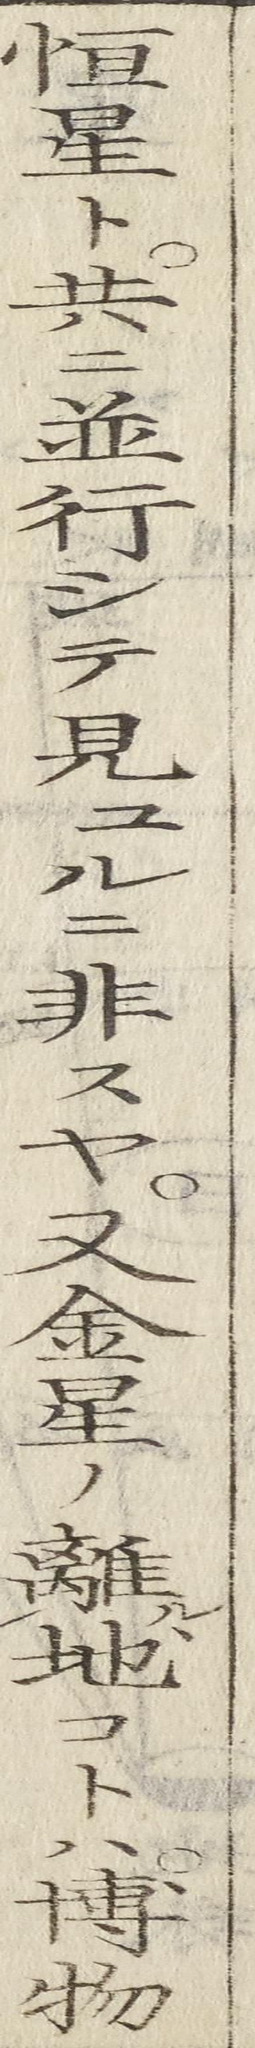恒星ト。共ニ並行シテ見ユルニ非スヤ。又金星ノ離ヽ地コトハ。博物
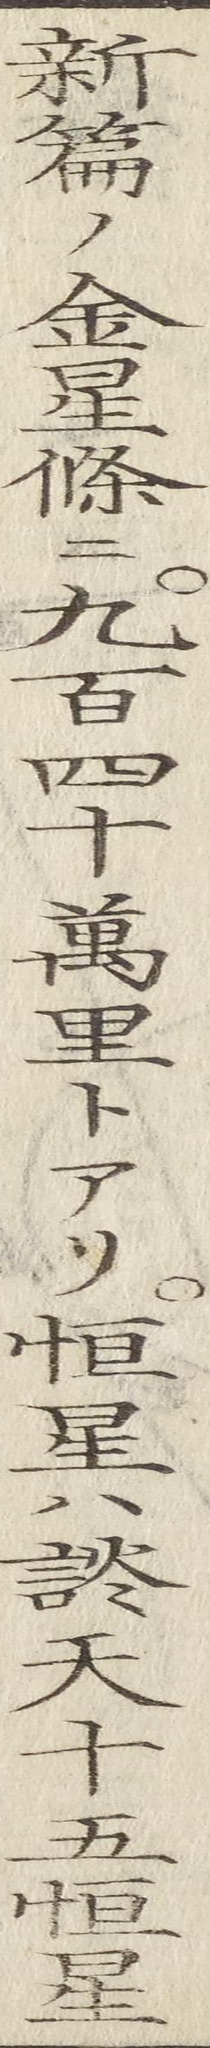新篇ノ金星条ニ。九百四十万里トアリ。恒星ハ談天十五恒星
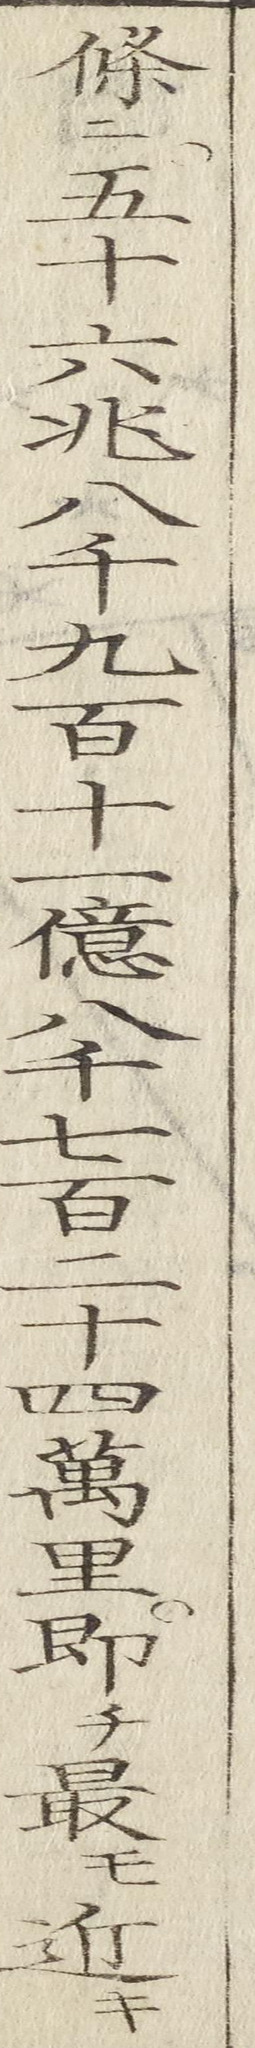条ニ。五十六兆八千九百十一億八千七百二十四万里。即チ最モ近キ
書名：護法新論　二編　上
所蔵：東京大学地震研究所図書室 Earthquake Research Institute Library, The University of Tokyo, JAPAN
